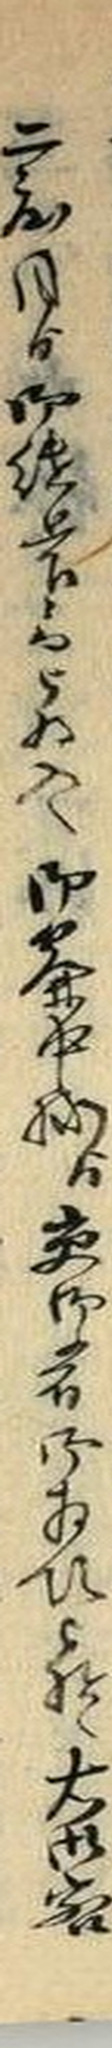二度目ゟ御継上下ニ而被為入御簾中様ゟ交御肴御拝領被遊候右御客
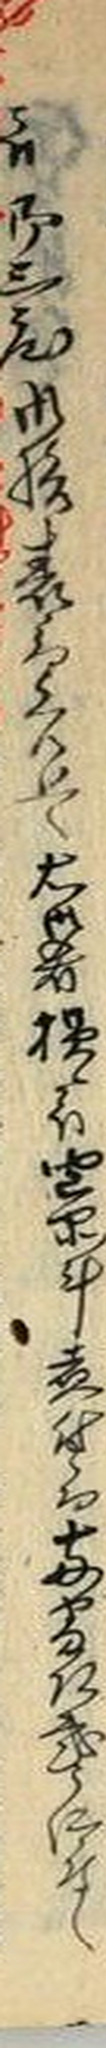ニ付御三度御膳表ニ而被差上候右御肴損候ニ付宜品斗表付ニ而両番頂戴仰付之
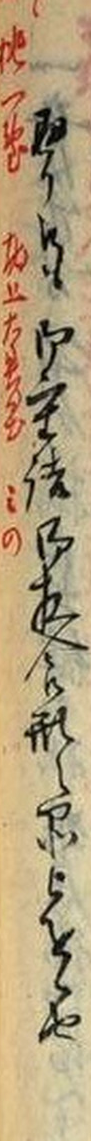廻り江も御重詰御夜食形之品被進候由
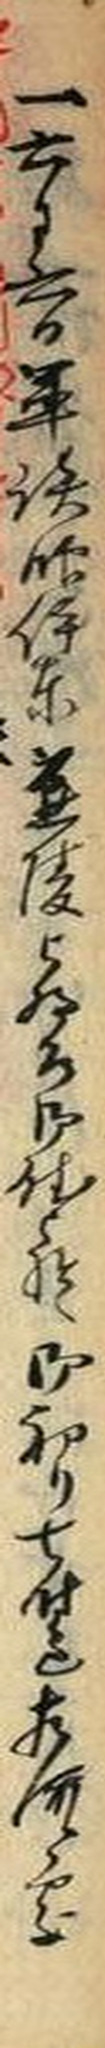一六月六日軍談師伊東燕凌被為召御聴遊候御初り七時過相済候処
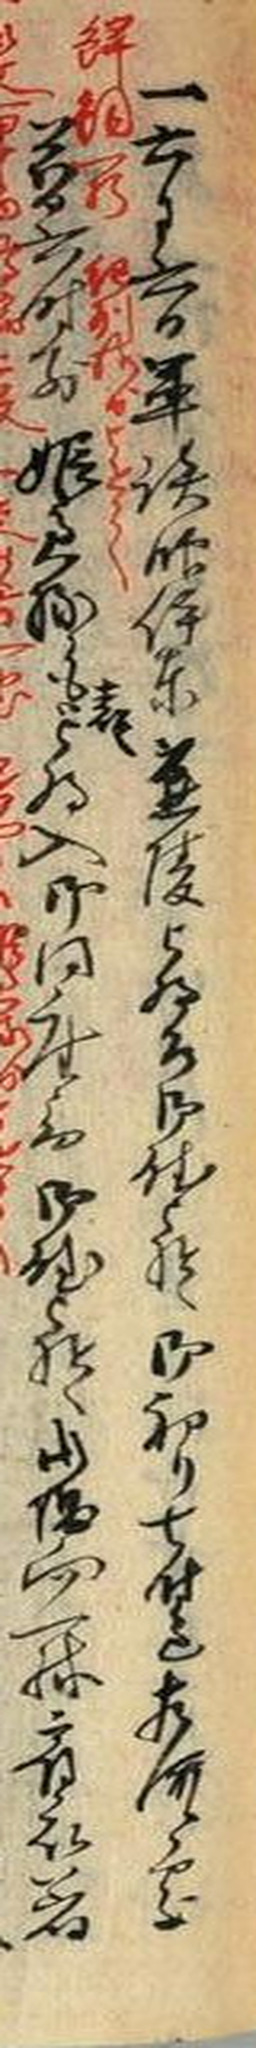暮六時前姫君様ニも表へ被為入御同座ニ而御聴被遊候御側向一統肩衣着
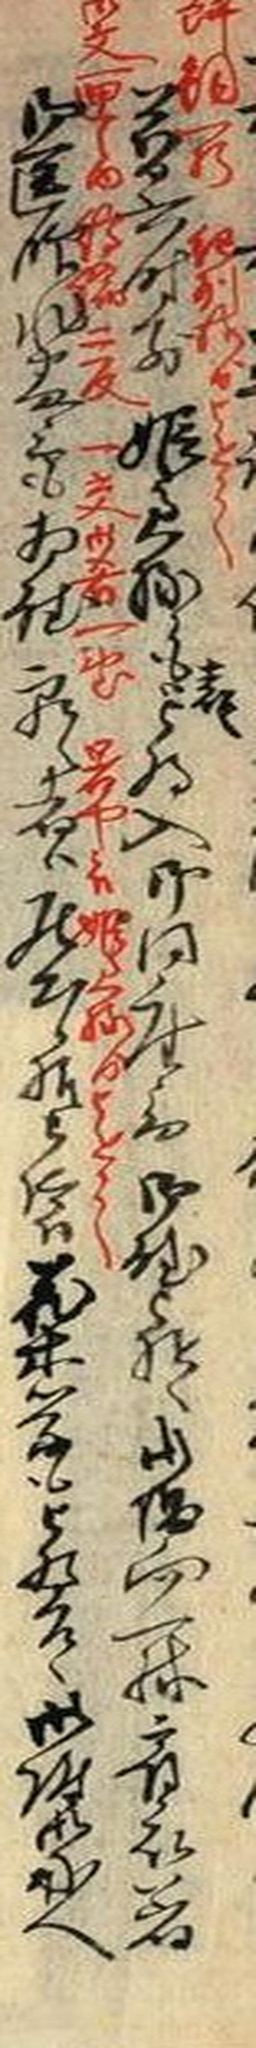御医師非番ニ而も拝聴願之者ハ罷出候様被仰付花木栄も被為召候御附御用人
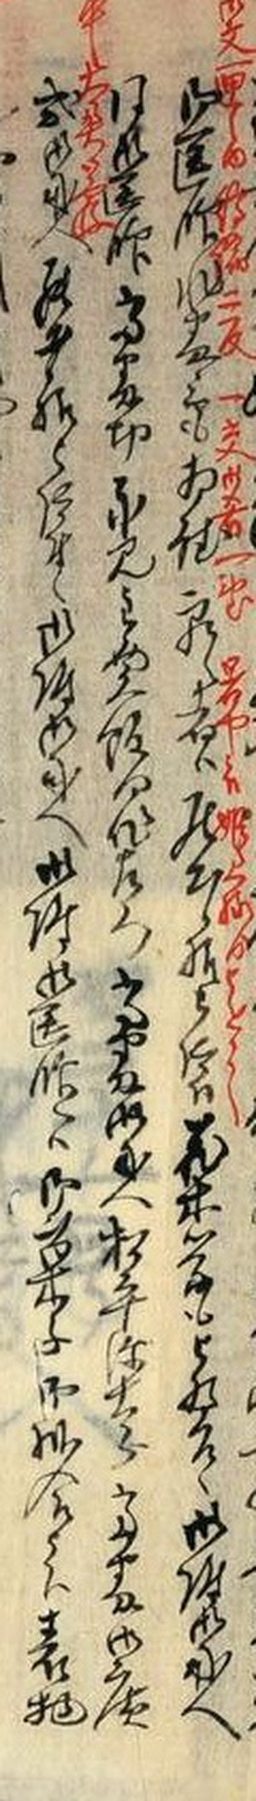同御医師当番切永見主殿飯田作左衛門当番御用人松平源太郎当番御広
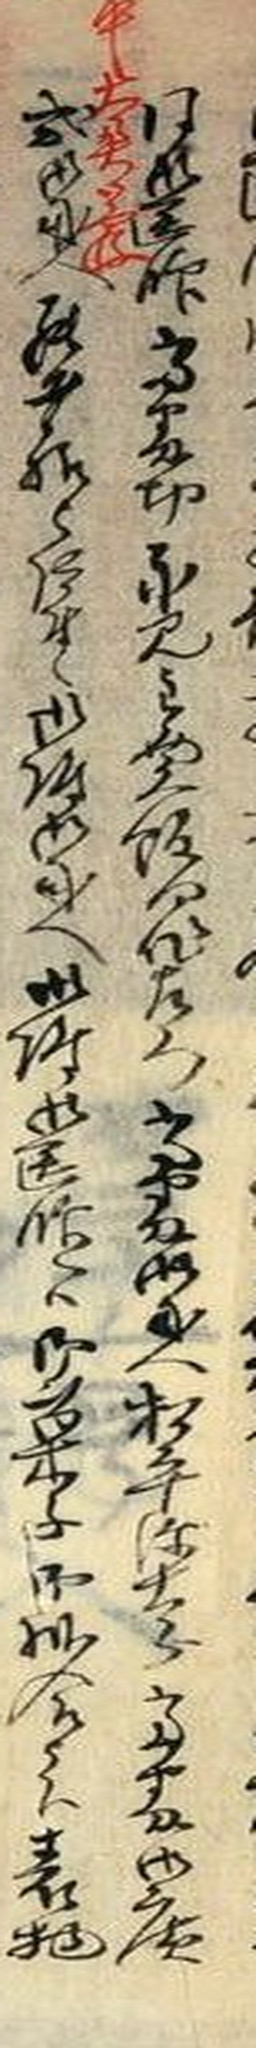式御用人罷出候様被仰付候御附御用人御附御医師へハ御菓子御掛合被下表物
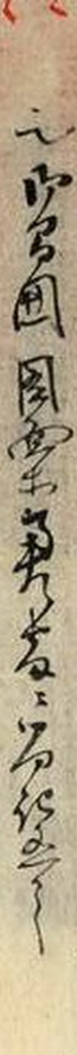之御間囲図面等奥番ニ留記有之
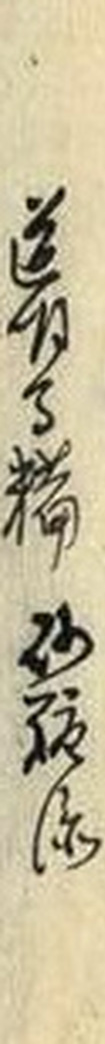道明寺糒砂糖添
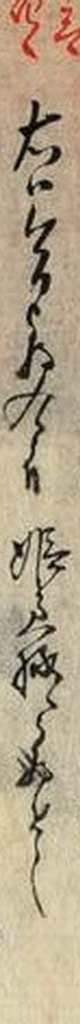右ハ今日被為入候付姫君様へ被為進之
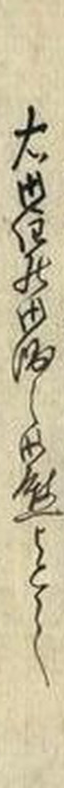右御住居御側之御慰被進之
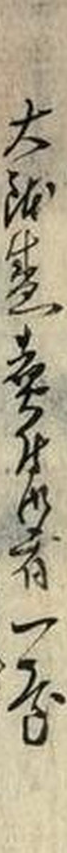大鉢盛煮付御肴一台
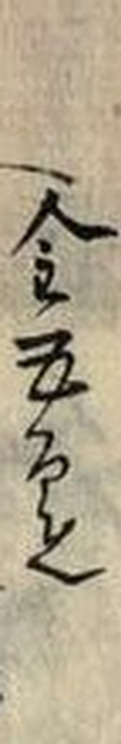金五百疋
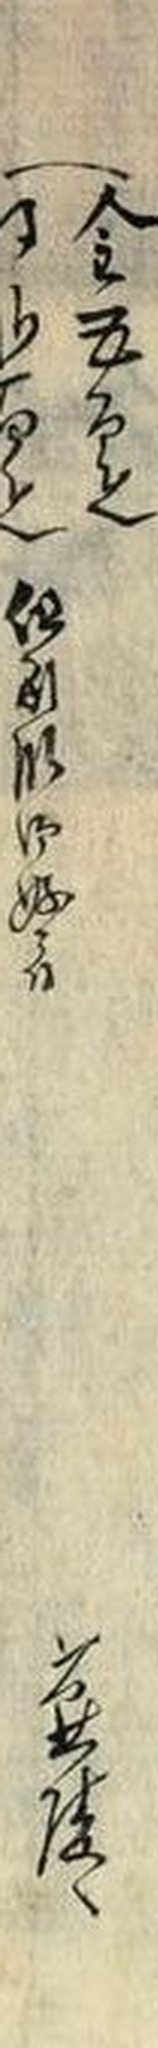同弐百疋但別段御好ニ付燕陵へ
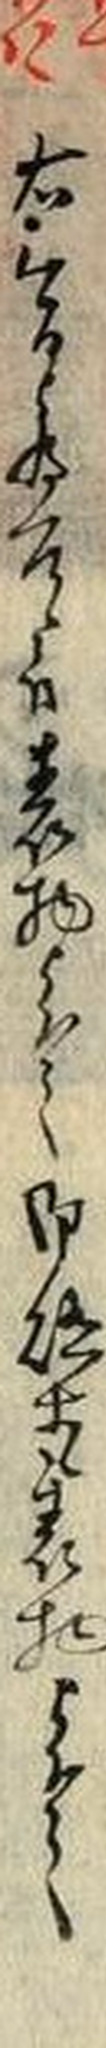右今日被為召候ニ付表物被下之御膳等も表被下之
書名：少傅日録抄（斉承付側向頭取日記、在府）
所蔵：福井県文書館 Fukui Prefectural Archives
